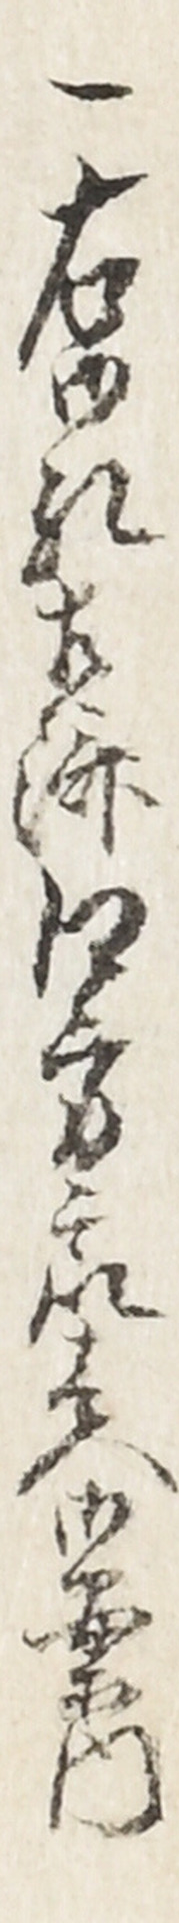一右御礼相済江方衆壱人御案内
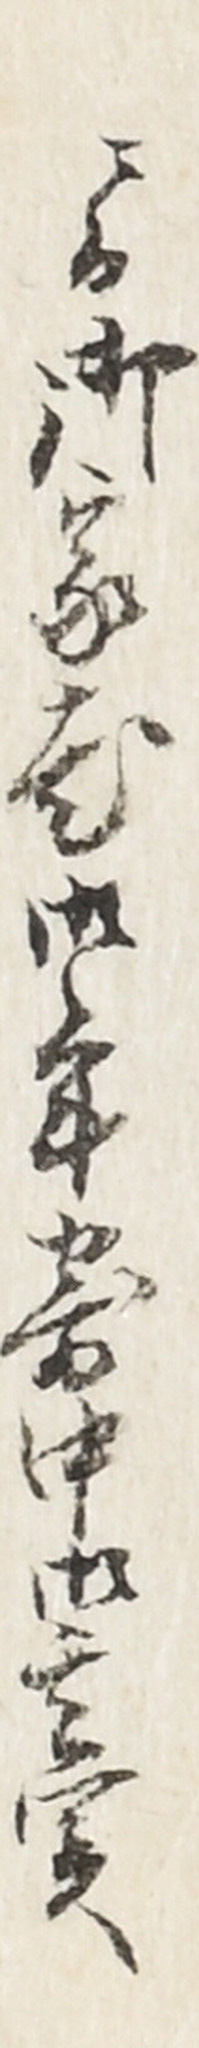ニ而御家老御年寄中御其関
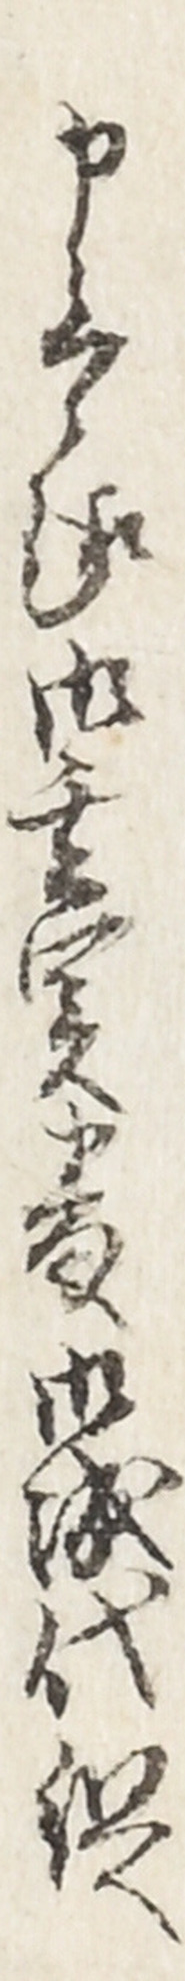申上候趣御其関番御城代組へ
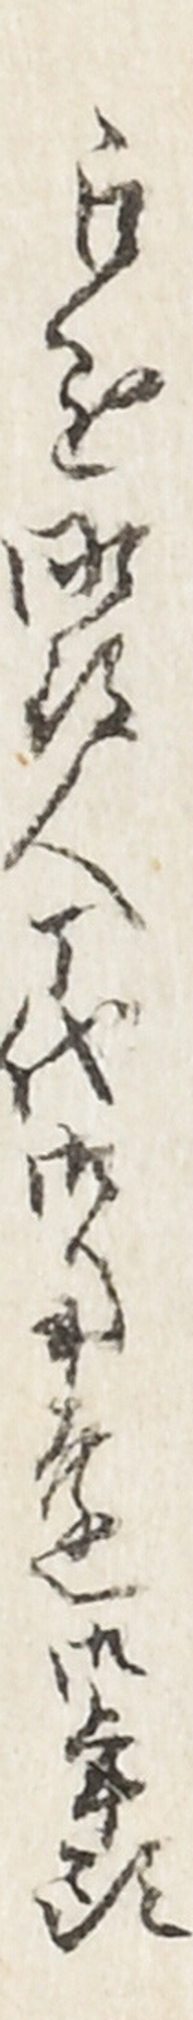江懸町役人丁代御用達御年頭
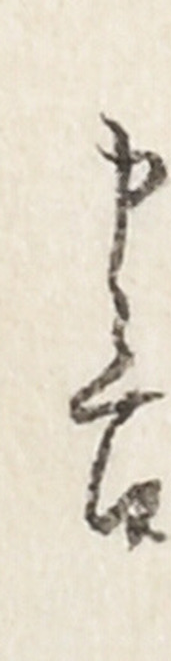申上候
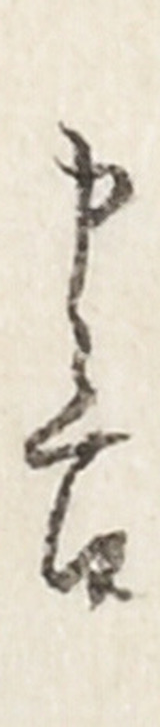申上候
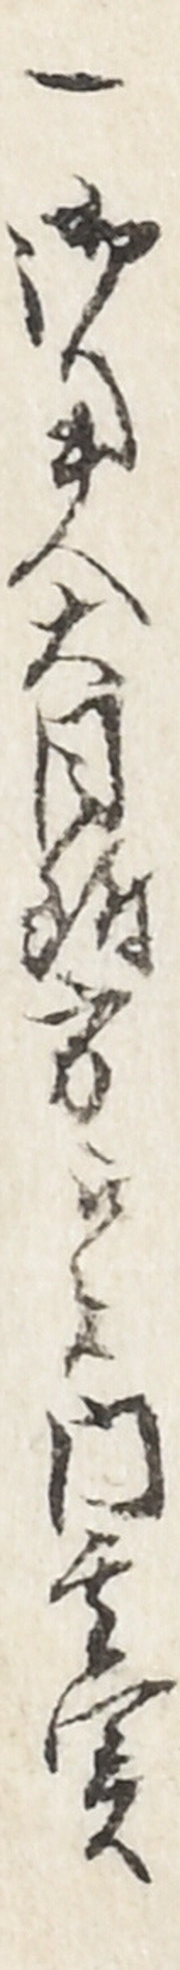一御用人大目附方江は内其関
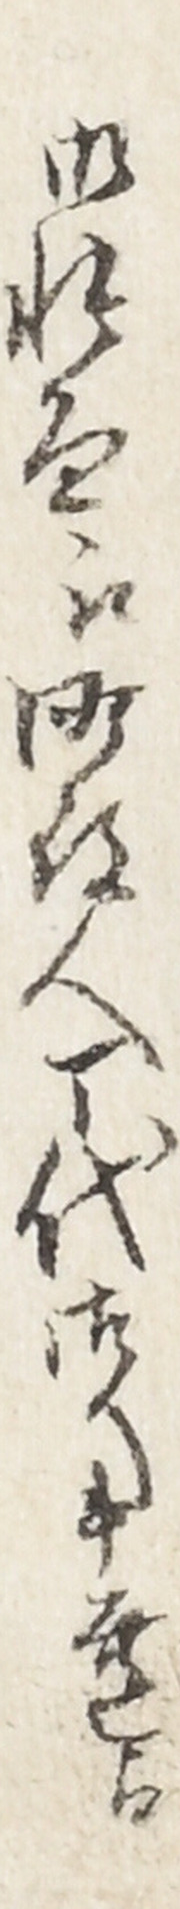御帳面江町役人丁代御用達と
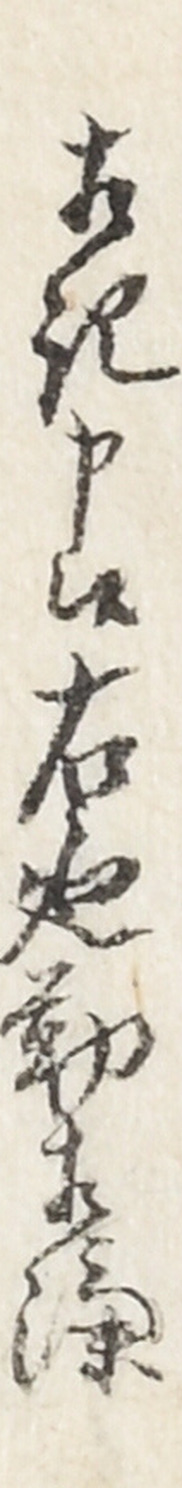相記申候右延勤相済
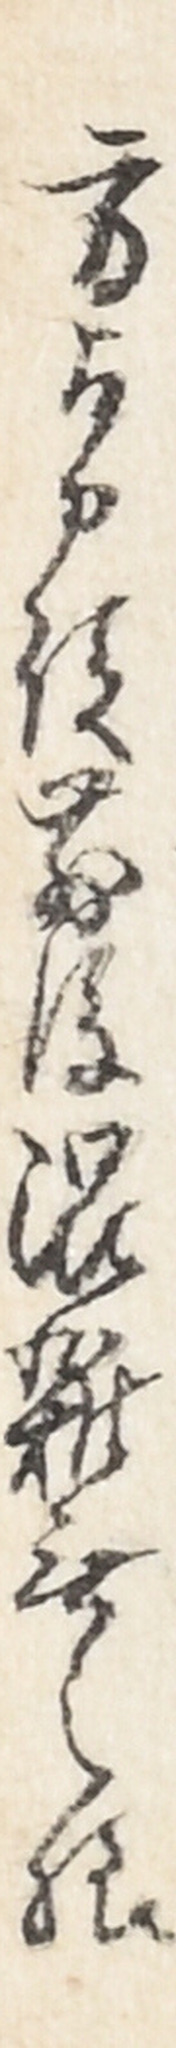方と申談前後混雑無之候様
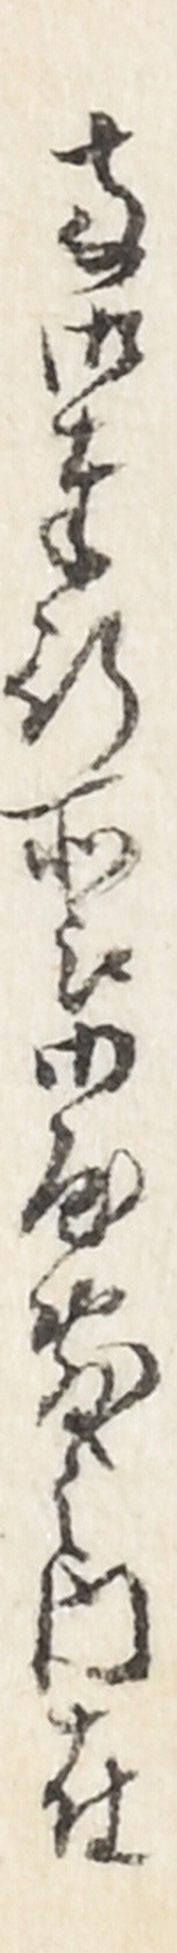両御奉行所江御屋敷之内在

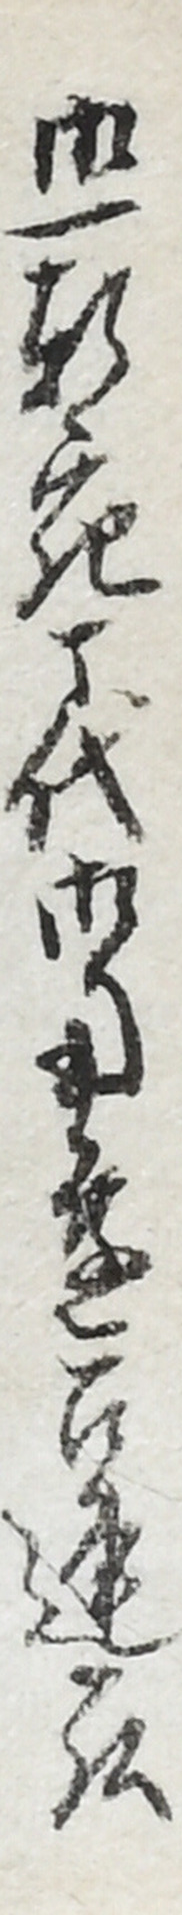御一軒宛丁代御用達召連被
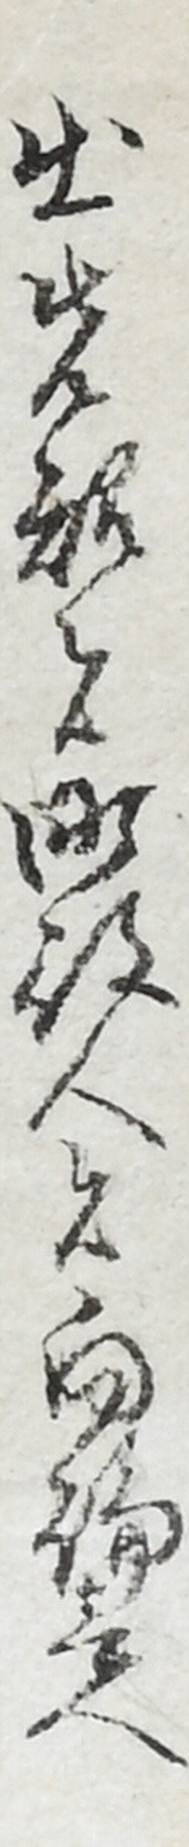出先規は町役人は勿論壱人
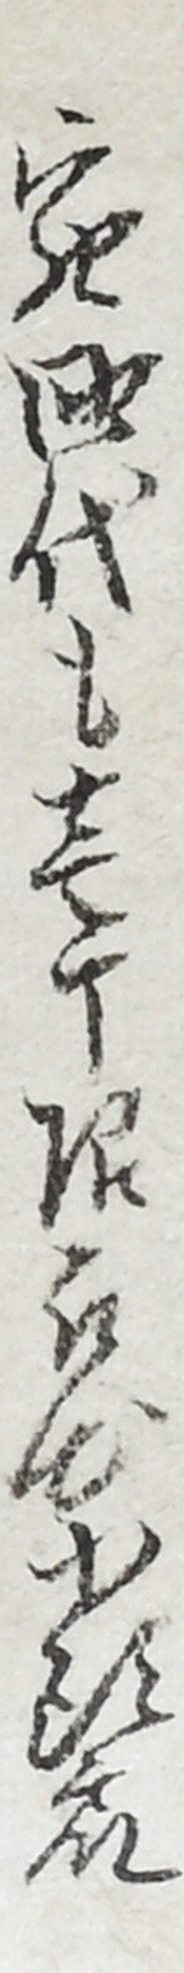宛町代も壱丁銀被出小頭衆
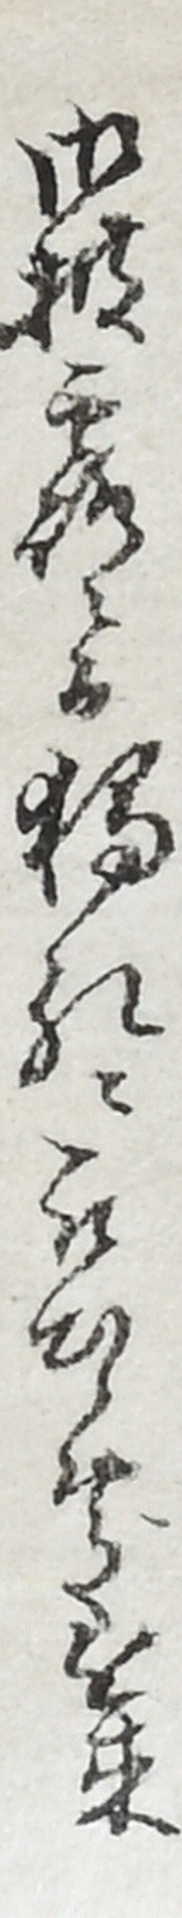御披露ニ而独礼ニ被出候処近来
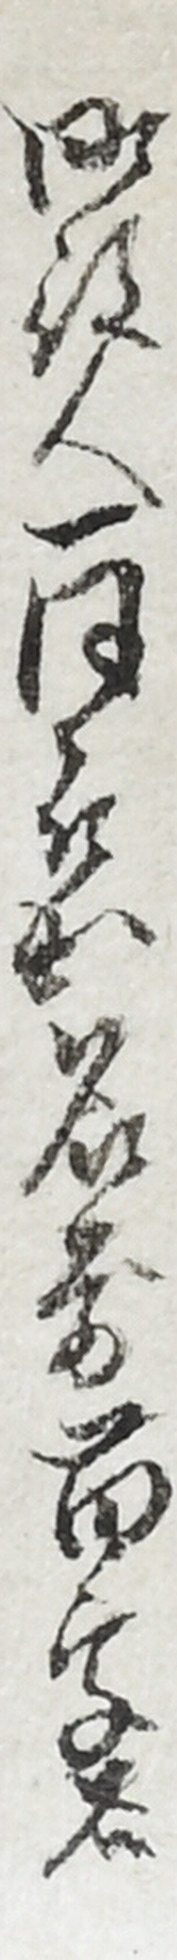御役人一同被出名前苗字名
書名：年内行事懐中録
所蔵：伊那市立高遠町図書館・合同会社AMANE
